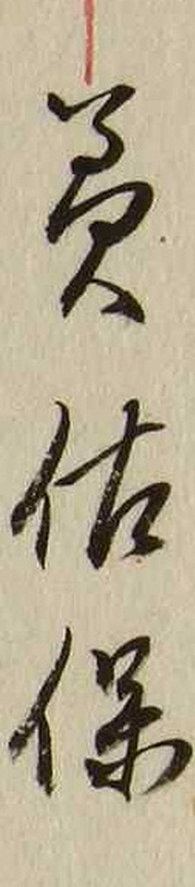美佐保
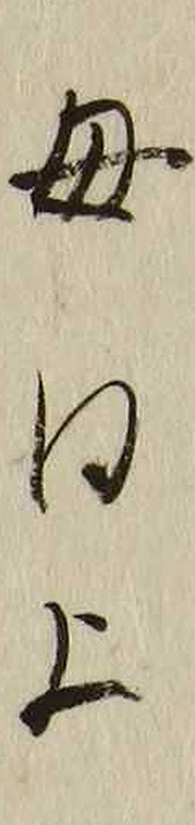母同上
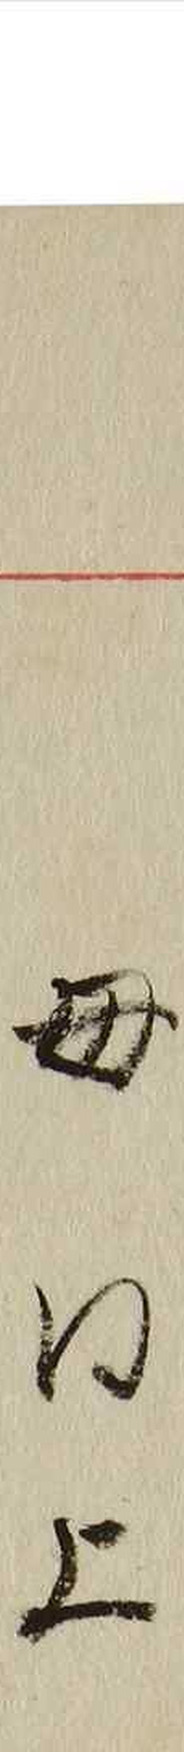母同上
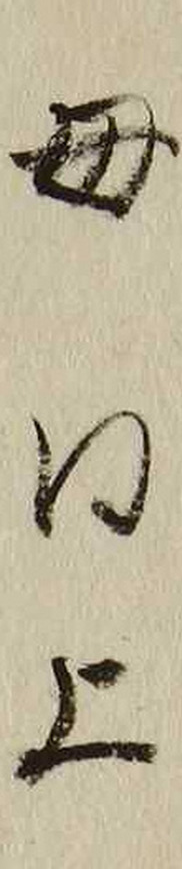母同上
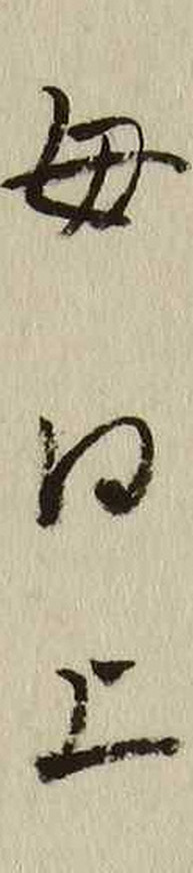母同上
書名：諸士系譜　巻之350　せ之部1冊全
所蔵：会津若松市立会津図書館
